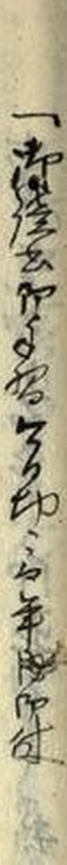一御読書御手習今日切ニ而年内御休
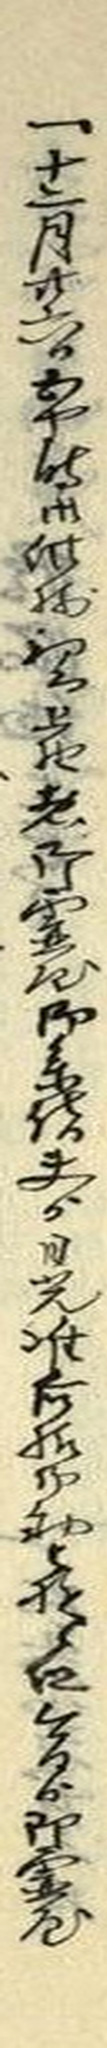一十二月廿六日五半時御供揃初而上野惣御霊屋御参詣夫ゟ日光准后様御勤被遊候但今日ゟ御霊屋
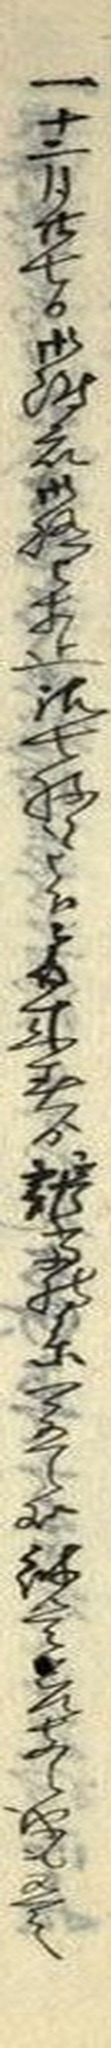一十二月廿七日御附衆御賄被相止銀七枚ツヽ被下ニ付来春ゟ弁当持参可有之処彼是差支之儀も有之
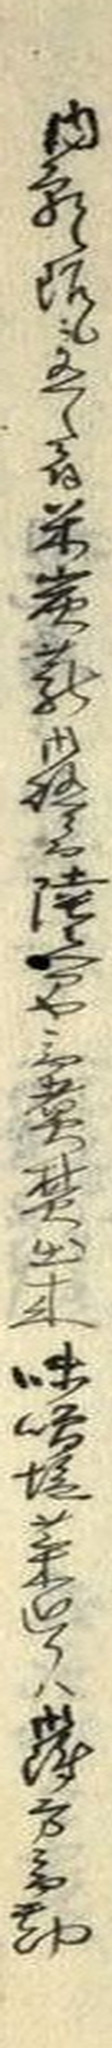内願之趣も有之ニ付米炭薪御賄ニ而陸尺部屋ニ而煮焚出来味噌塩菜廻りハ御附方ニ而勘
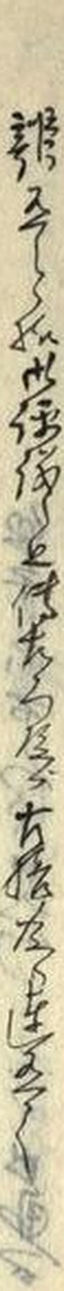弁有之候様御評議之上伝左衛門殿ゟ左膳殿へ達有之
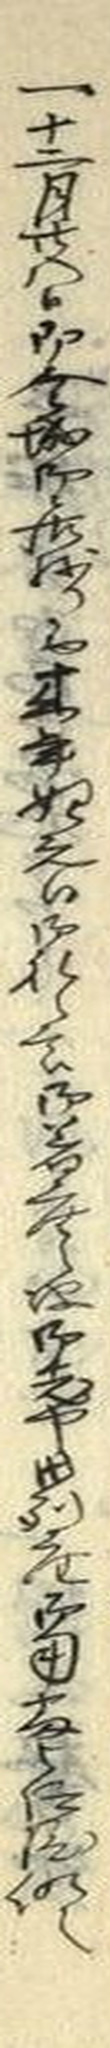一十二月廿八日御登城御居残りニ而来年始元日御礼之節御着座之儀御老中御列座御用番被仰渡依之
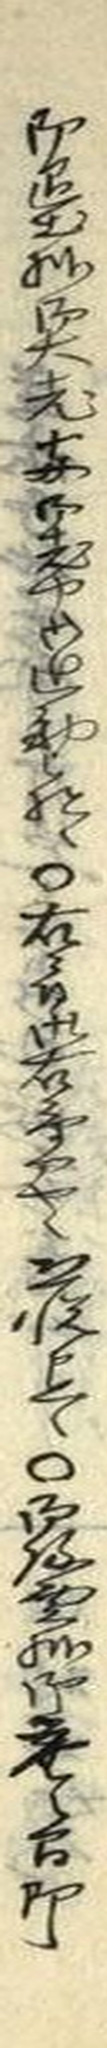御退出掛御大老両御老中御廻勤被遊候〇右ニ付御御右筆部屋へ恐悦申上之〇御帰殿掛御座之間御
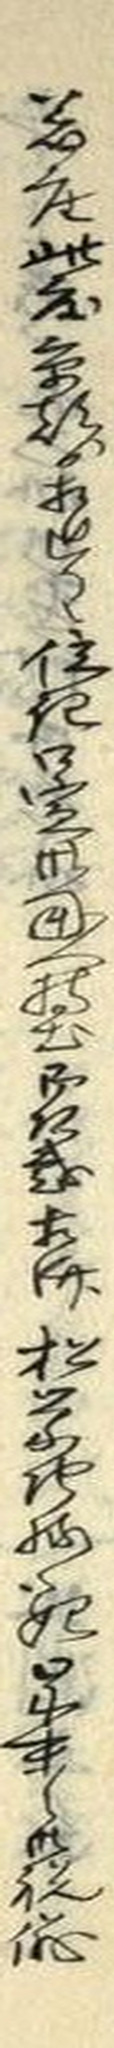着座此度京都ゟ相廻り候位記口宣御用人持出御頂戴相済松栄院様御始歳末之御
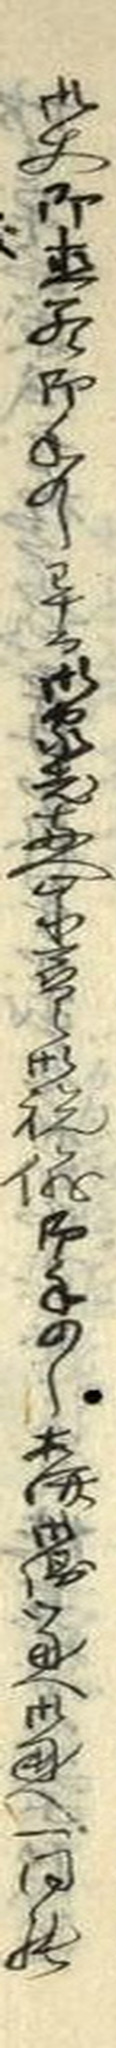御使御直答御手のし畢而御家老両人歳暮之御祝儀御手のし相済御側御用人御用人一同罷
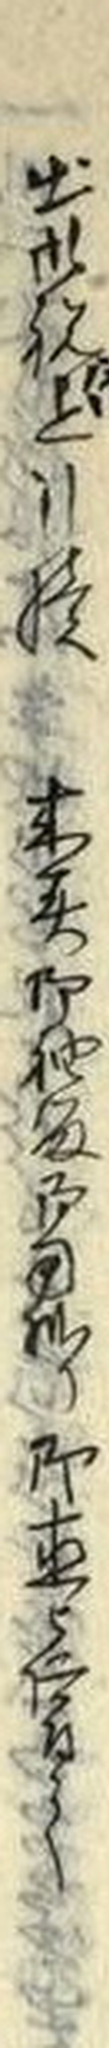出御祝儀申上引続来春御袖留御用掛り御直被仰付之松平主馬
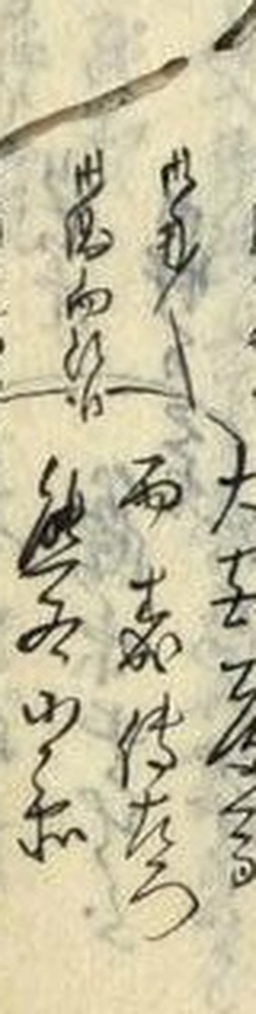御側向頭取熊谷小兵衛
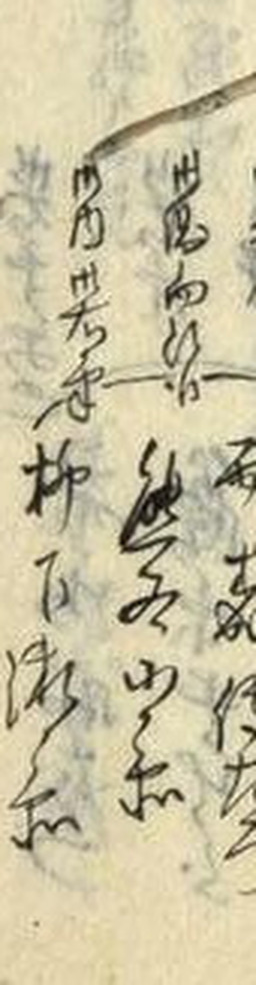御内御右筆柳下瀬兵衛

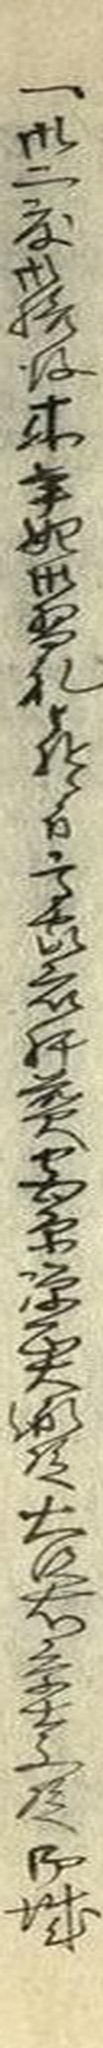一御二度御膳後来年始御習礼被遊候ニ付高家衆肝煎宮原源正大卿殿大沢右京大夫殿御城
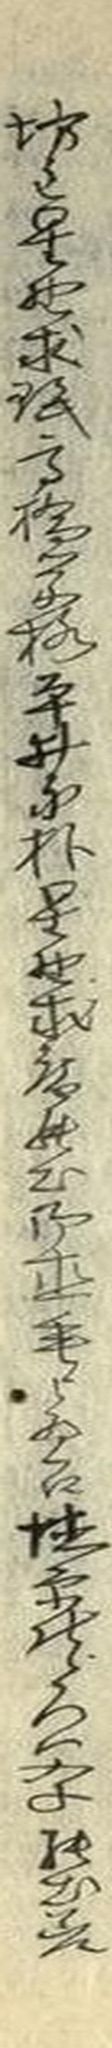坊主星野求珉高橋栄格平井永朴星野求庵罷出御直垂被為召埴原次郎右衛門父子罷出差
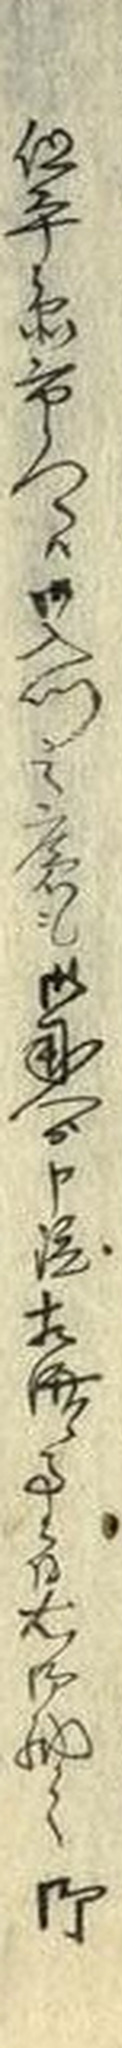但平兵衛市右衛門ヘハ御入門之廉も御用人ゟ申渡相済候事ニ付右御納之御
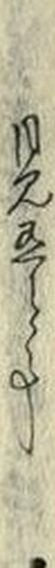目見有之事
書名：少傅日録抄（斉善付側向頭取日記、在府）
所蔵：福井県文書館 Fukui Prefectural Archives
